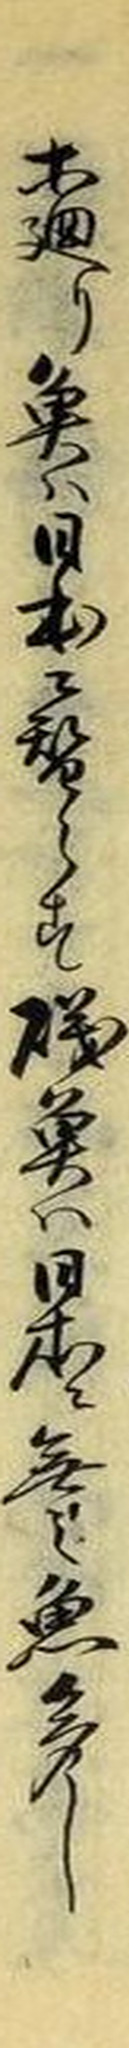等廻り魚ハに日本ニ替らす磯魚ハ日本ニ無之魚多し
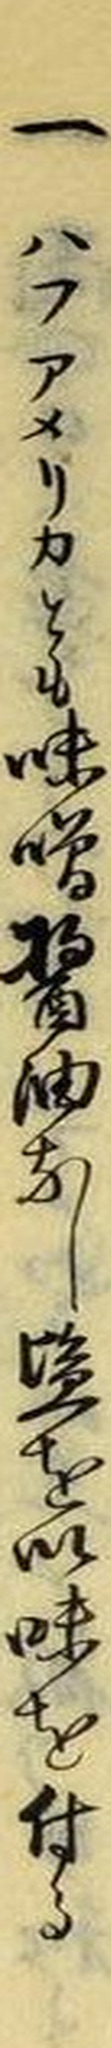一ハフアメリカとも味噌醤油なし塩を以味を付る
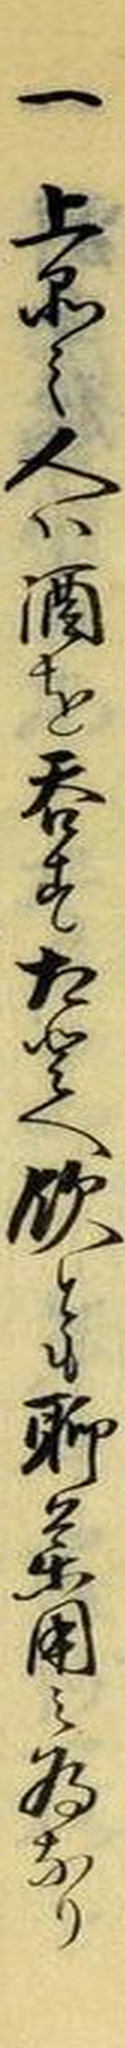一上品之人ハ酒を呑すたとへ飲とも聊薬用の為なり
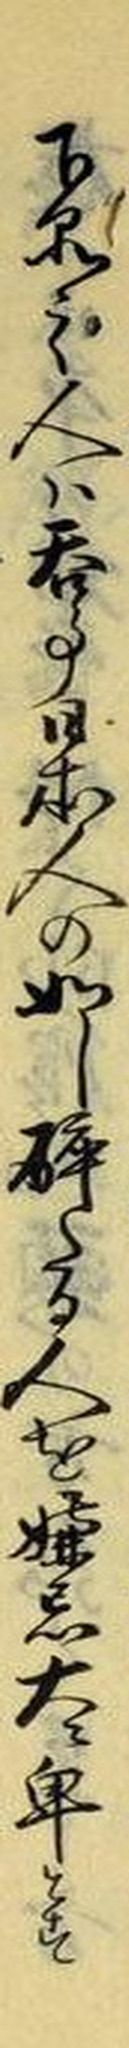下品之人ハ呑事日本人の如し酔たる人を嫌忌大ニ卑とす
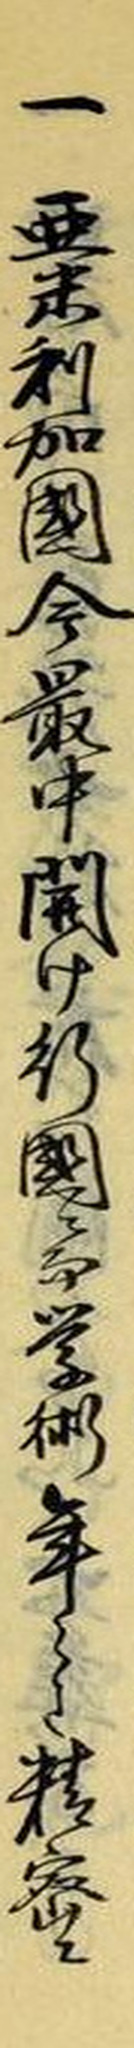一亜米利加国今最中開け新国ニ而学術年々に精密ニ
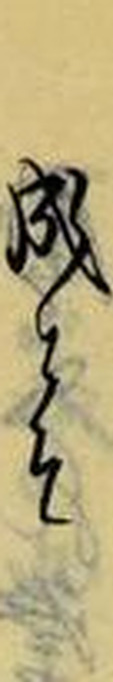成とそ
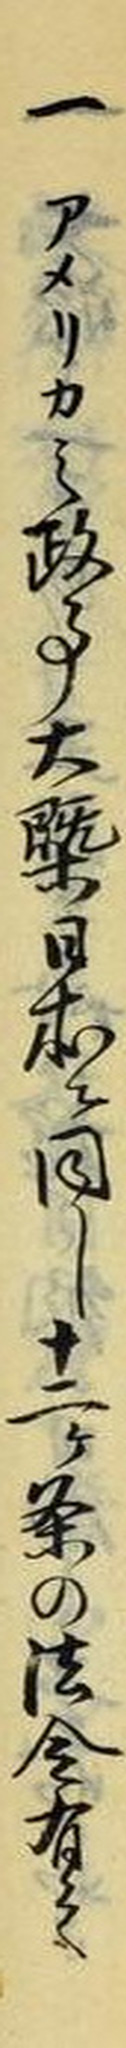一アメリカ之政事大概日本ニ同し十二ヶ条の法令有之
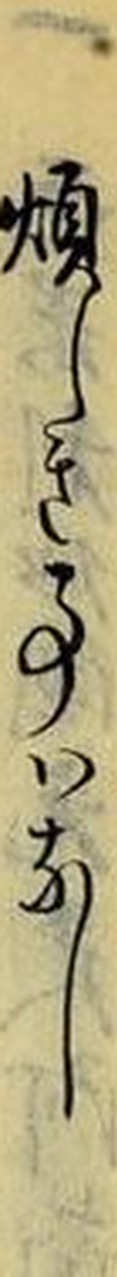煩しき事ハなし
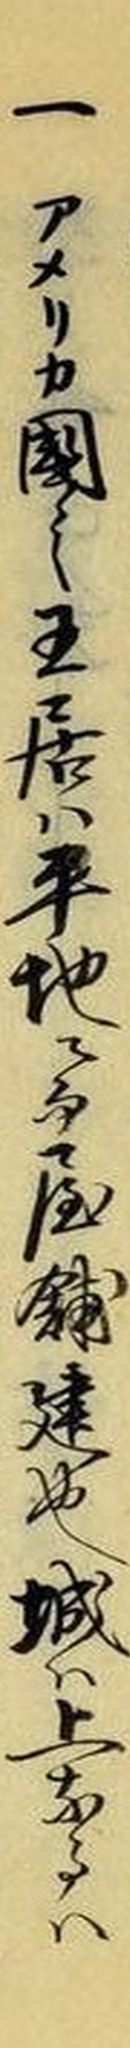一アメリカ国之王居ハ平地ニ而屋鋪建也城ハ上なるハ
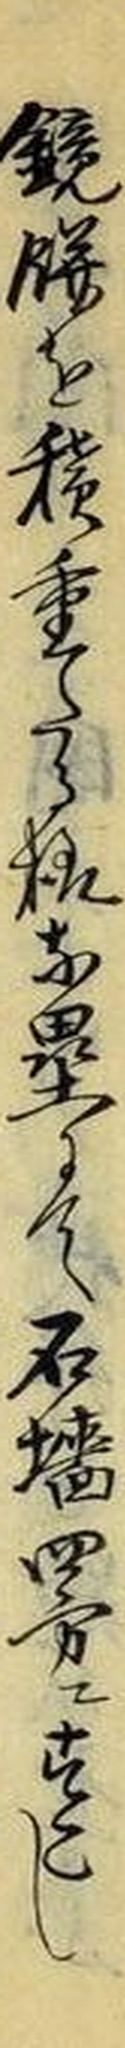鏡餅を積重たる様な塁にて石墻四方ニすこし
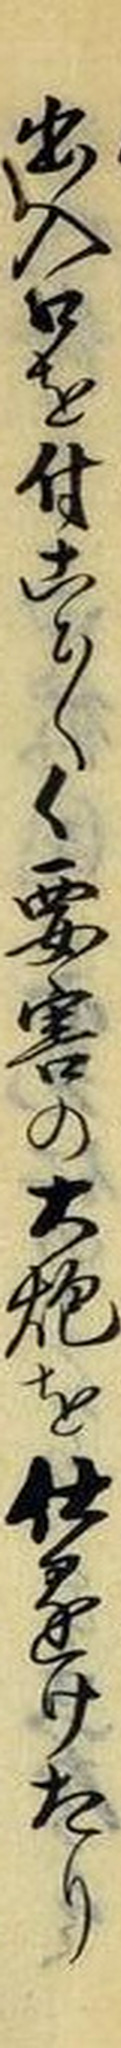出入口を付こと〳〵く要害の大砲を仕懸けたり
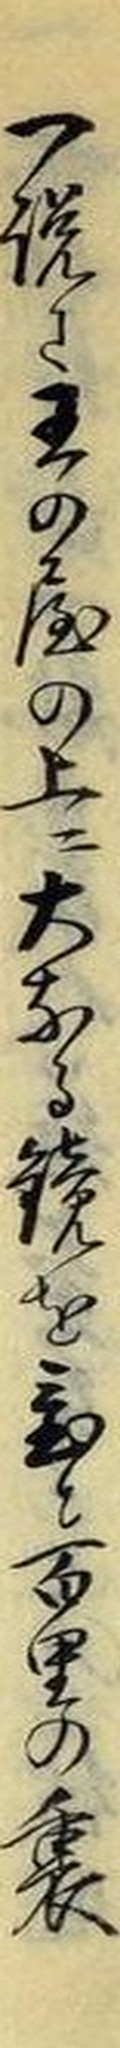一説に王の屋の上ニ大なる鏡を置て百里の裏
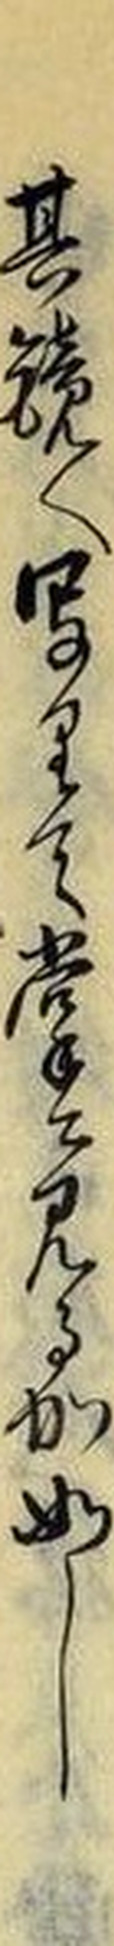其鏡へ写りて掌ニ見るが如し
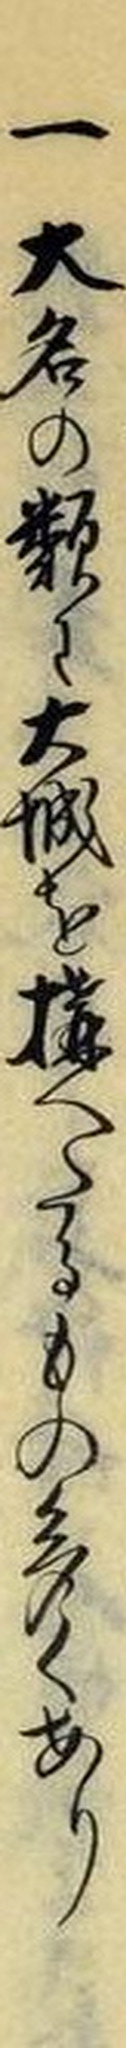一大名の類に大城を構へたるもの多くあり
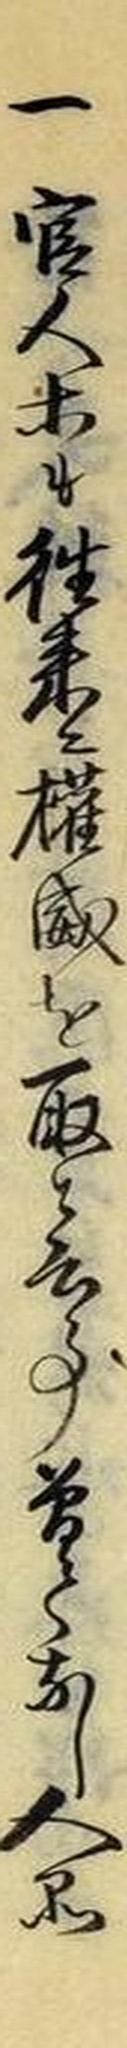一官人等も往来ニ権威を取と云事曽てなし人品
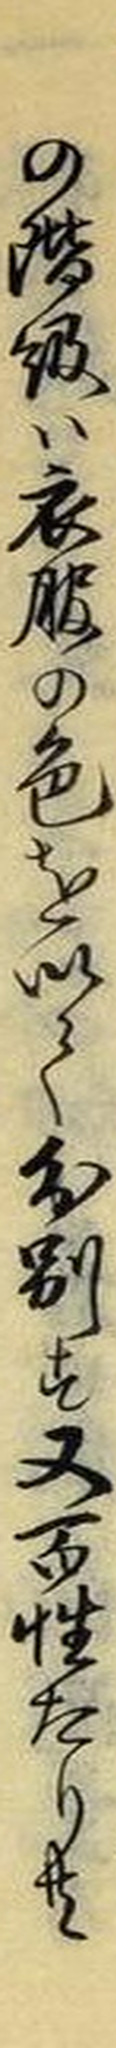の階級ハ衣服の色を以て分別す又百姓たり共
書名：漂客談奇（備考雑録写8）
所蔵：福井県文書館 Fukui Prefectural Archives
